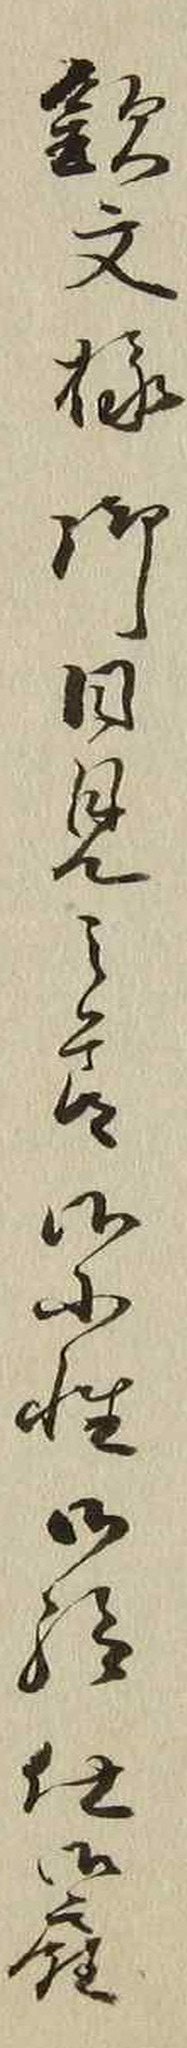欽文様御日見之節御小性御給仕御雇
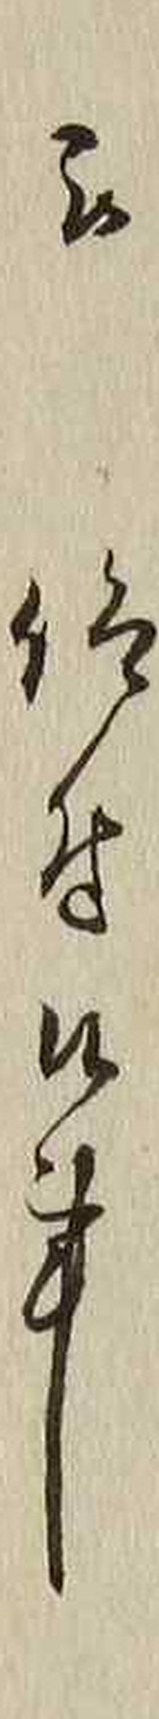被仰付候事
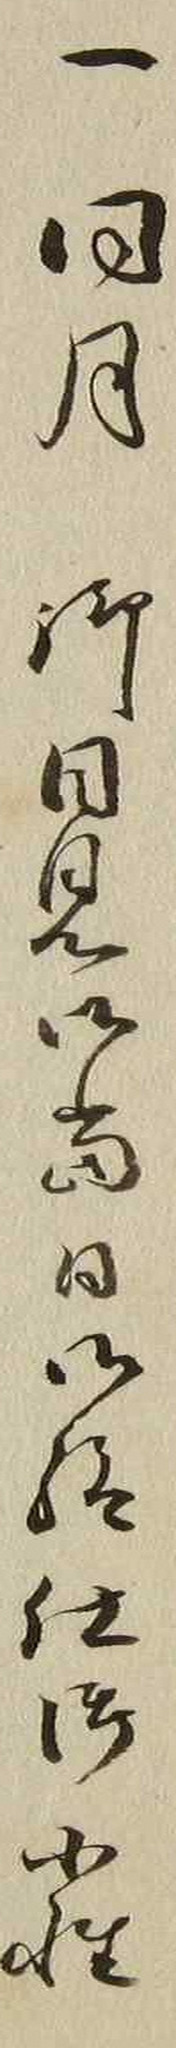一同月御日見御当日御給仕御小性
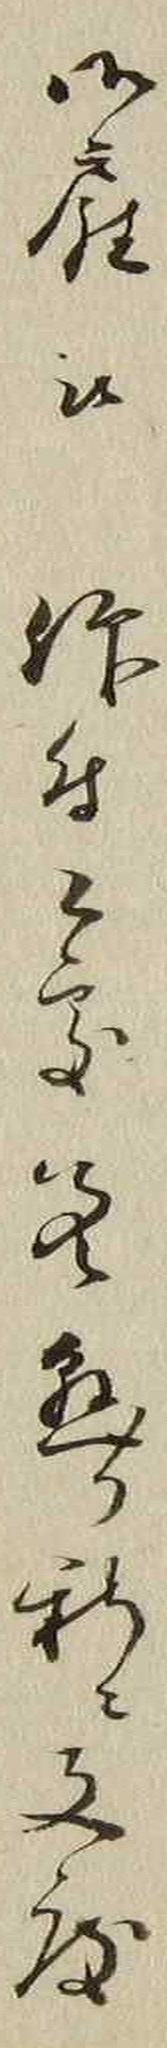御雇被仰付候処差懸り新ニ支度
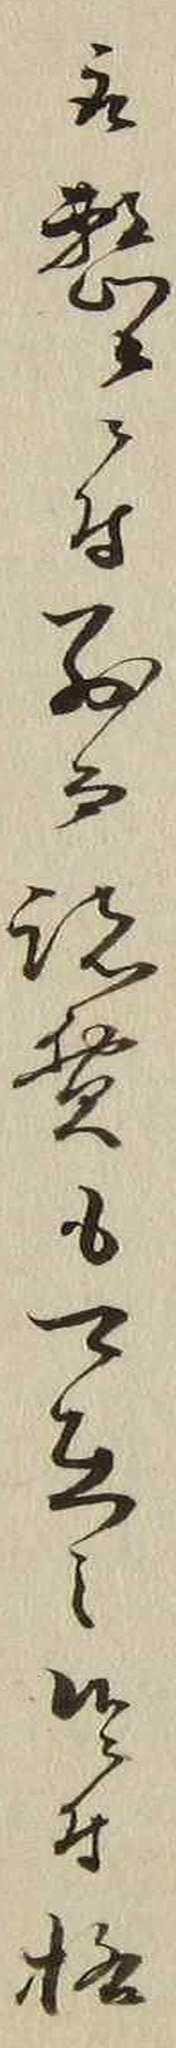取整候ニ付別而諸費も可在之候ニ付格
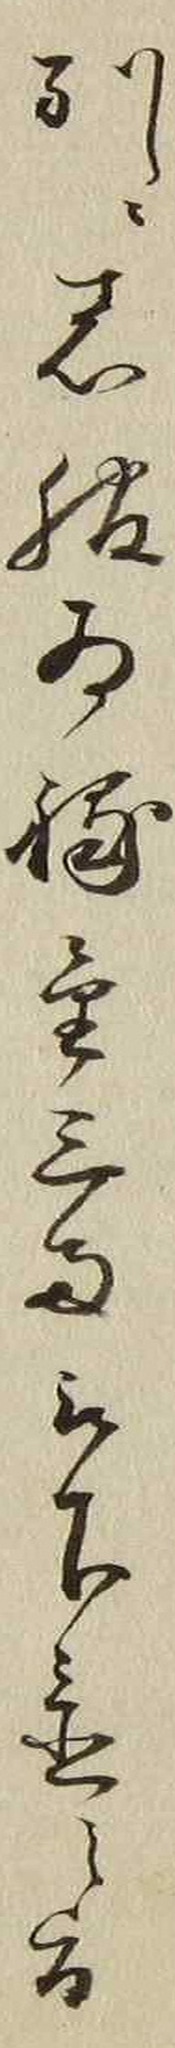別ニ着服為補金三両被下置之旨
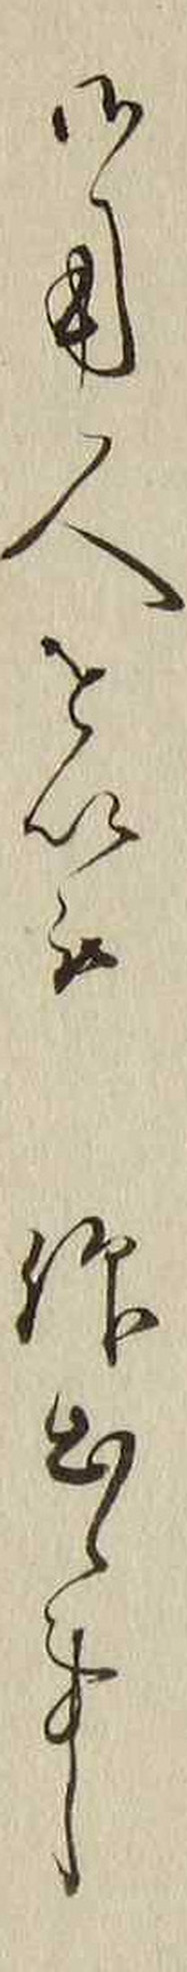御用人を以被仰出候事
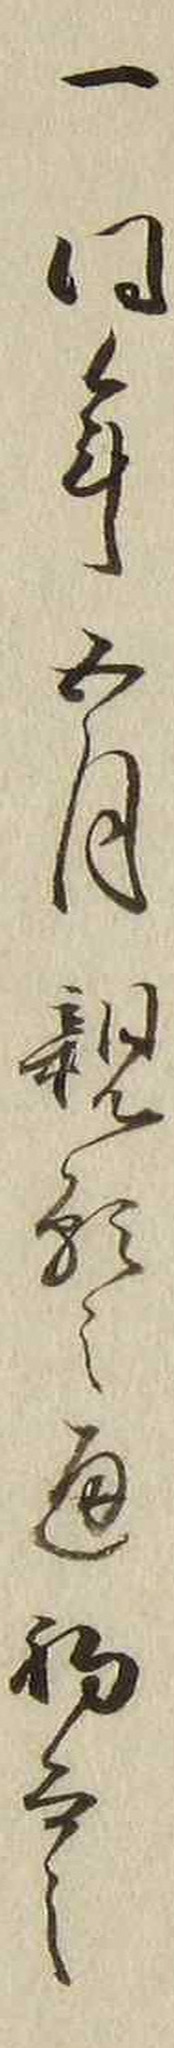一同年五月親願之通初而之
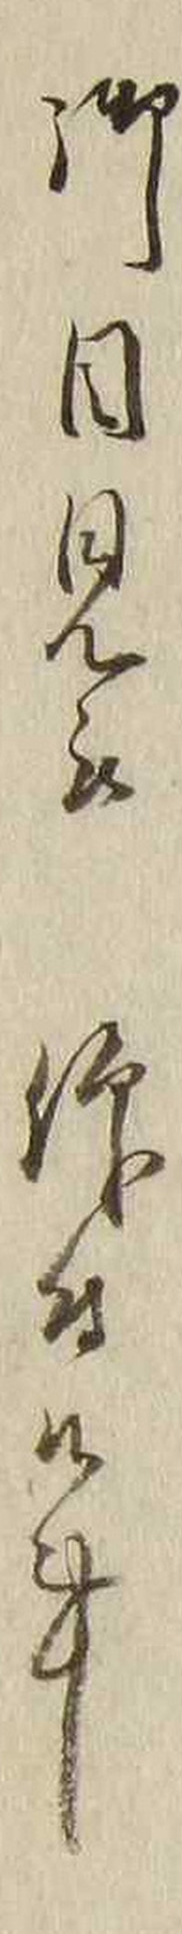御目見被仰付候事

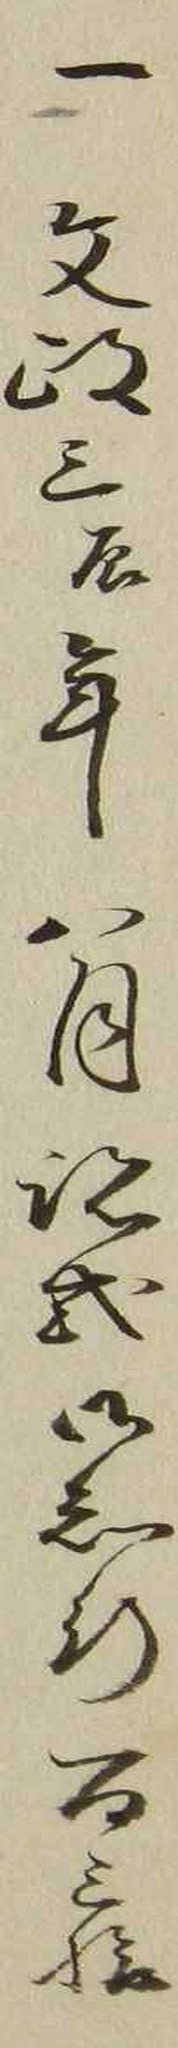一文政三辰年八月跡式御知行百三拾
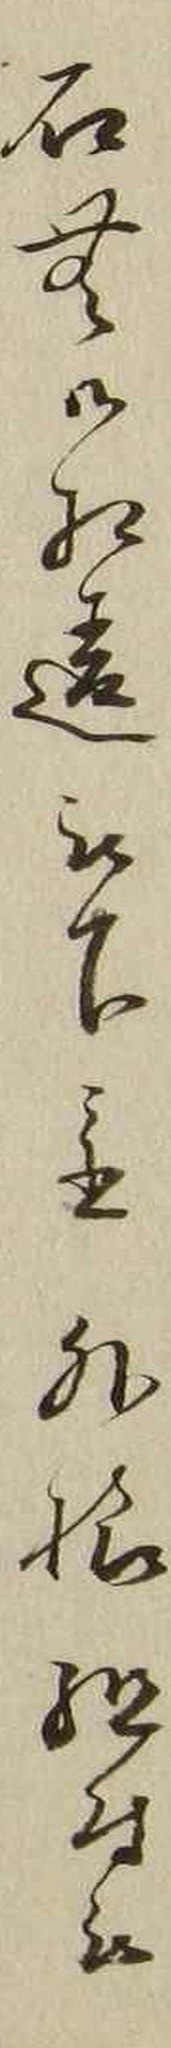石無御相違被下置外様組付被
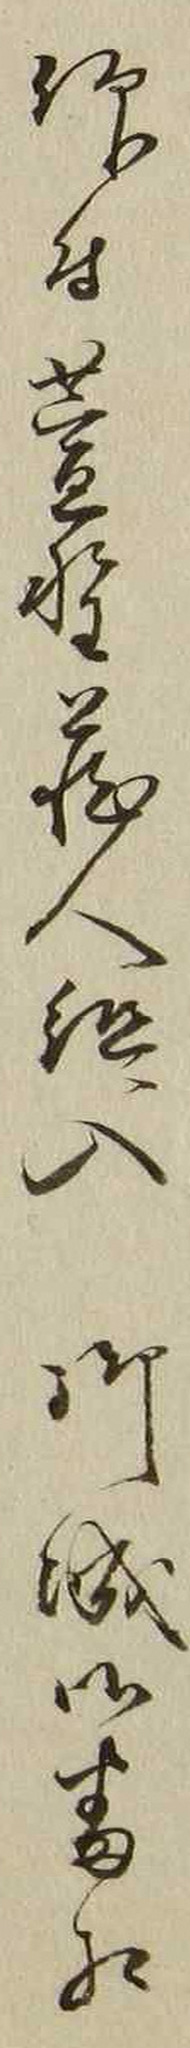仰付萱野蔵人組へ入御城御番相
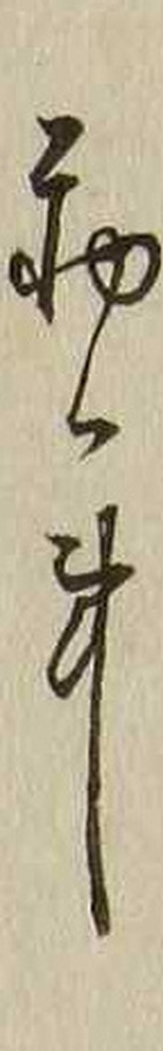勤候事
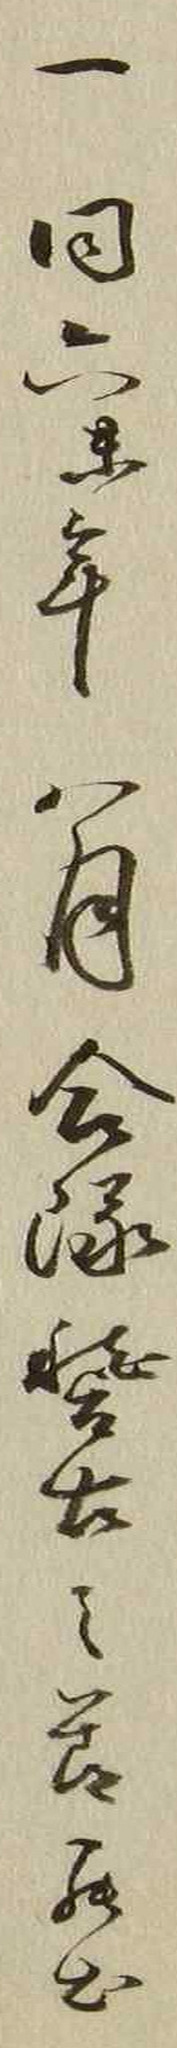一同六未年八月合隊稽古之節罷出
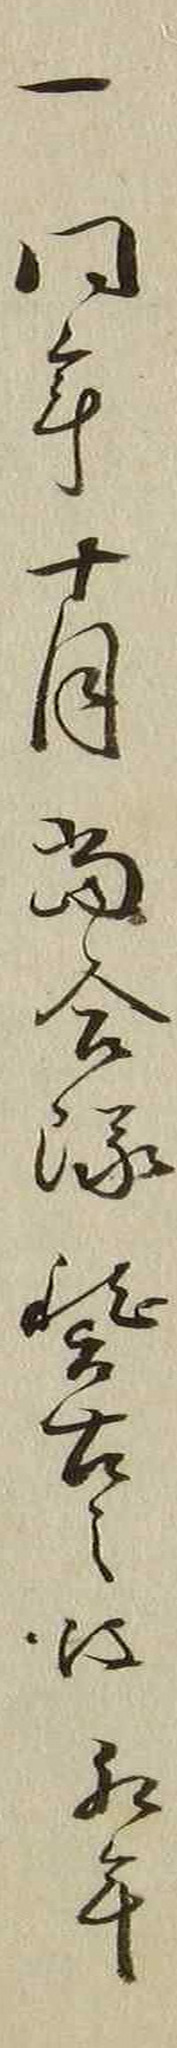一同年十月当合隊稽古之儀卯年
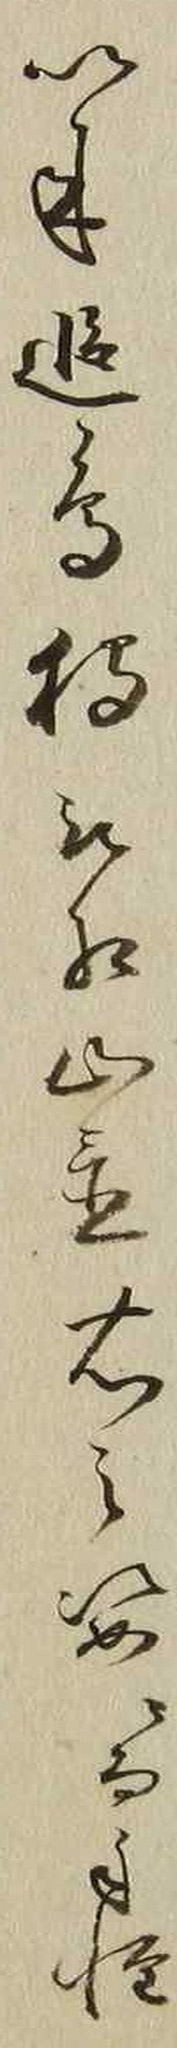以来追鳥狩被相止置右之姿ニ而手軽
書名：諸士系譜　巻之25　い之部25
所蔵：会津若松市立会津図書館
